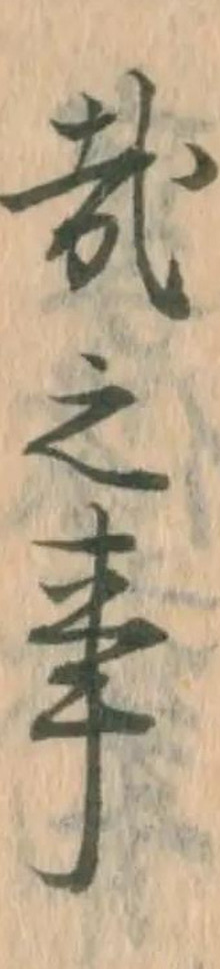哉之事
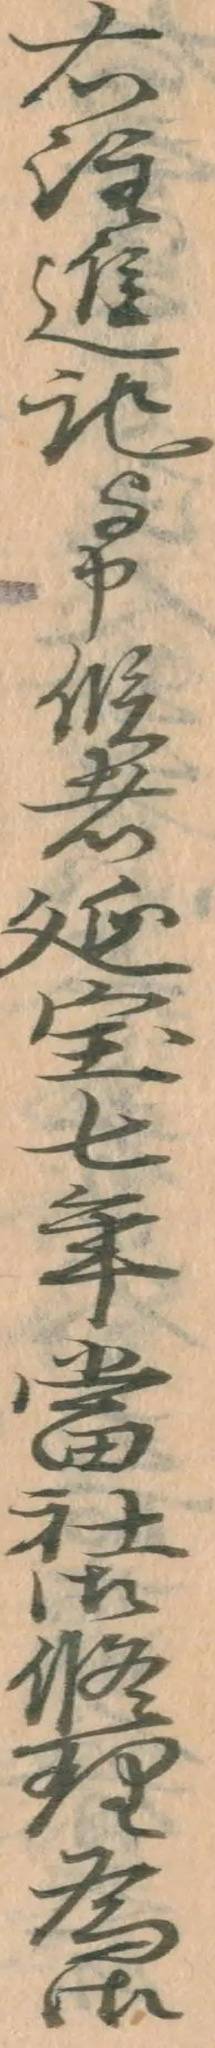右注進記と申候者延宝七年當社御修理為御
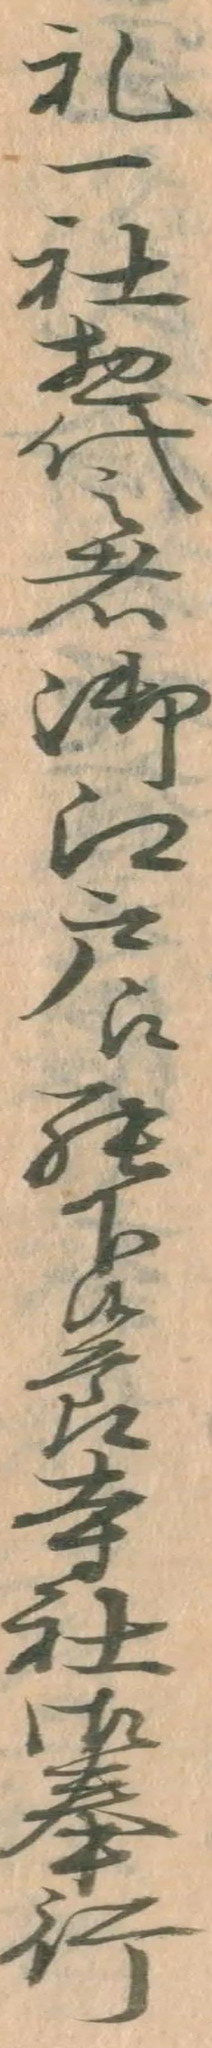礼一社惣代之者御江戸え罷下候節寺社御奉行
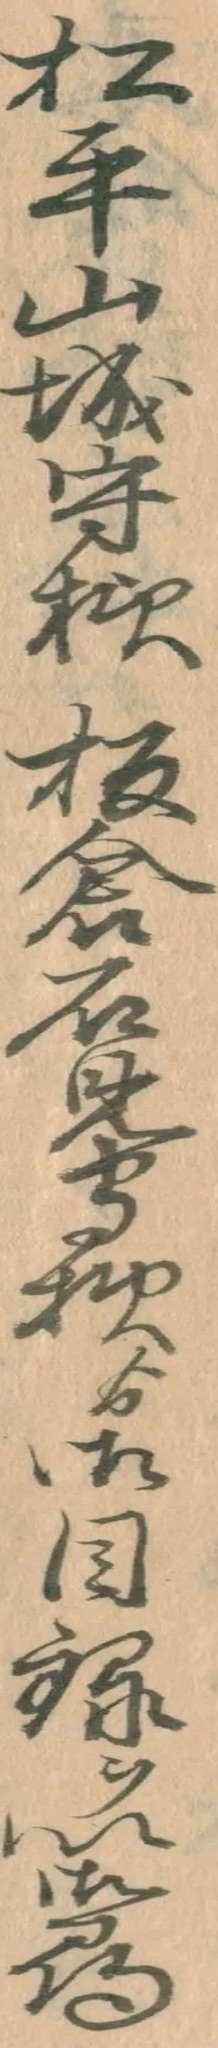松平山城守様板倉石見守様ゟ御目録を以御尋
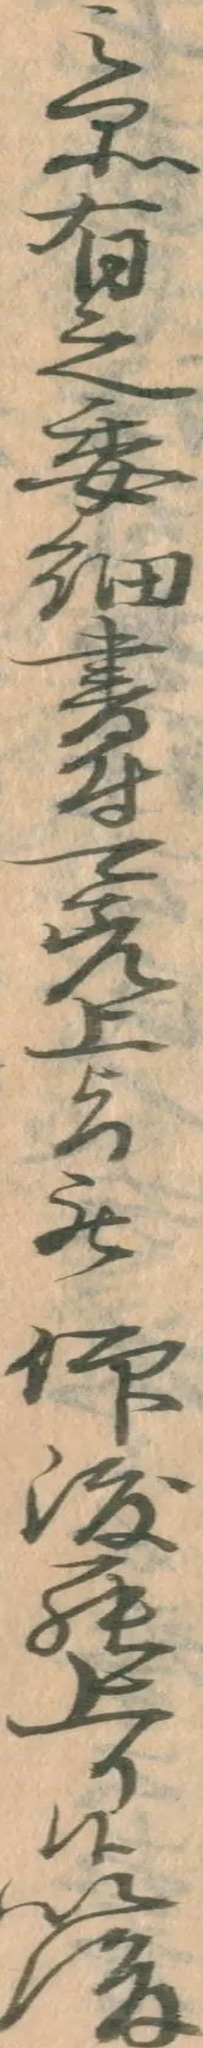之品有之委細書付可差上旨被仰渡罷上り候以後
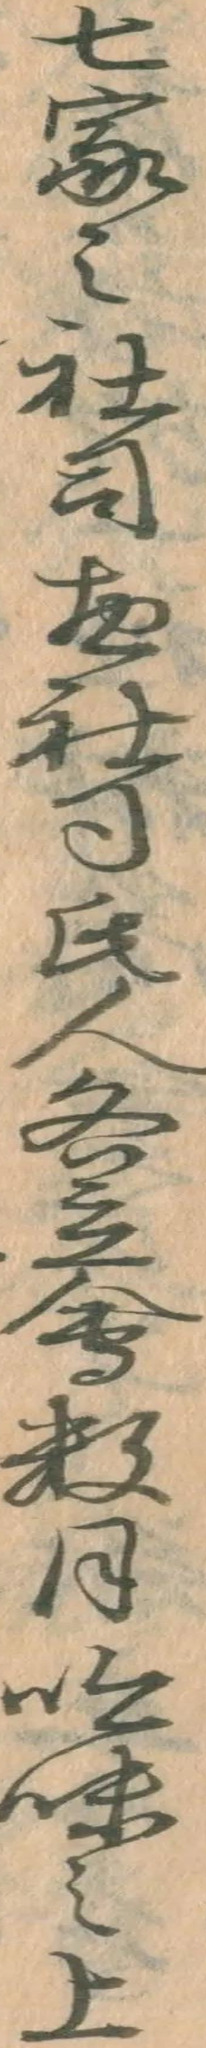七家之社司惣社司氏人各立會数月吟味之上
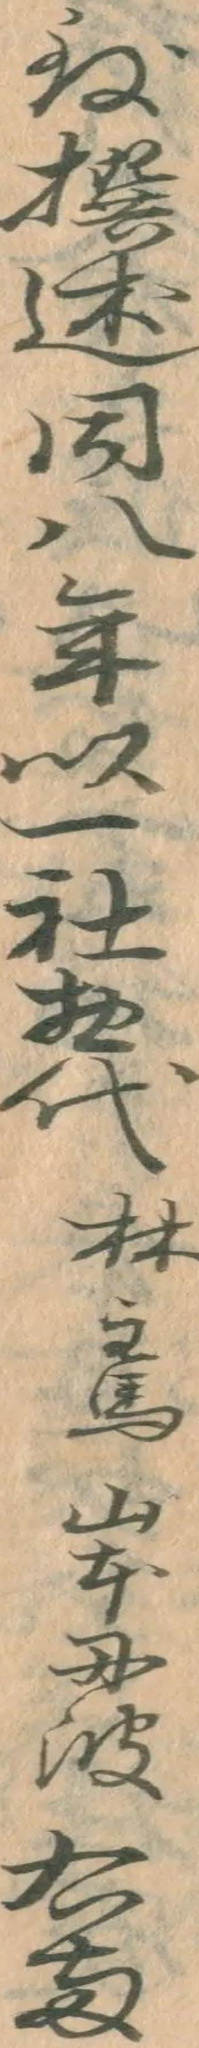致撰述同八年以一社惣代林主馬山本丹波右両
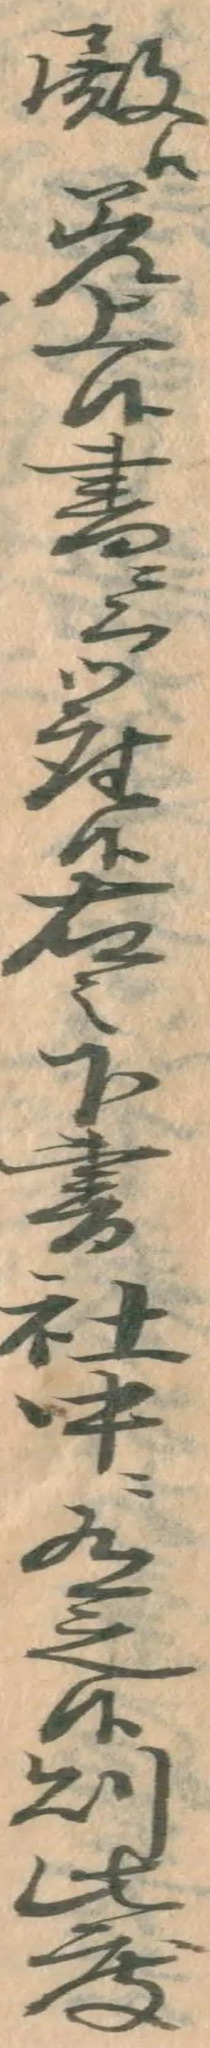殿え差上候書ニ而御座候右之下書社中ニ有之候則此度
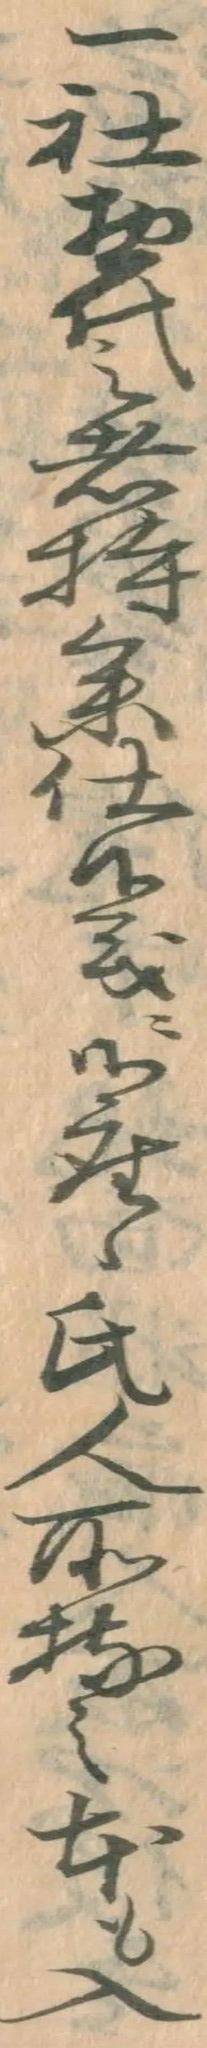一社惣代之者持参仕候義ニ御座候氏人所持之本も入
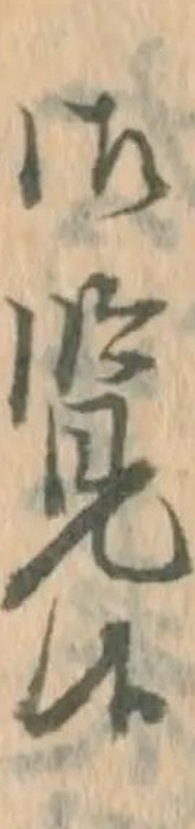御覚候
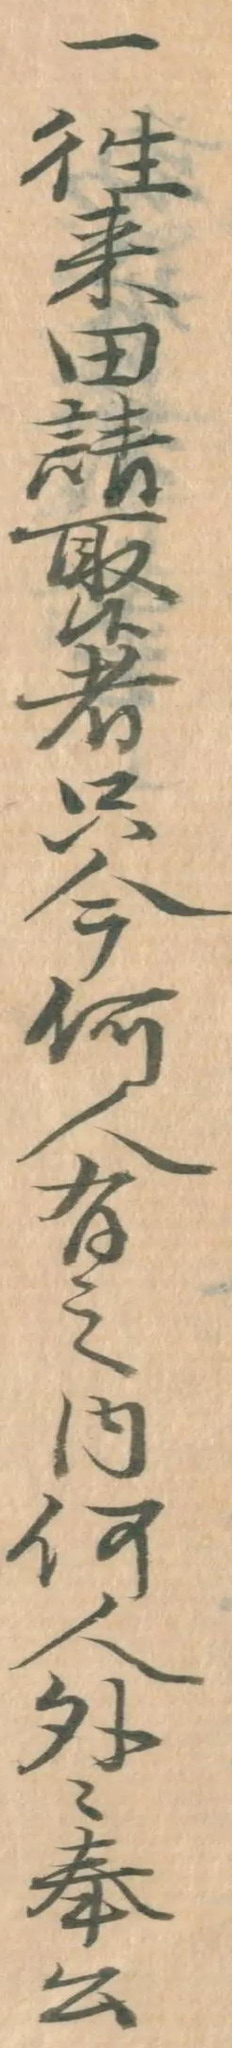一、往来田請取候者只今何人有之内何人外ニ奉公

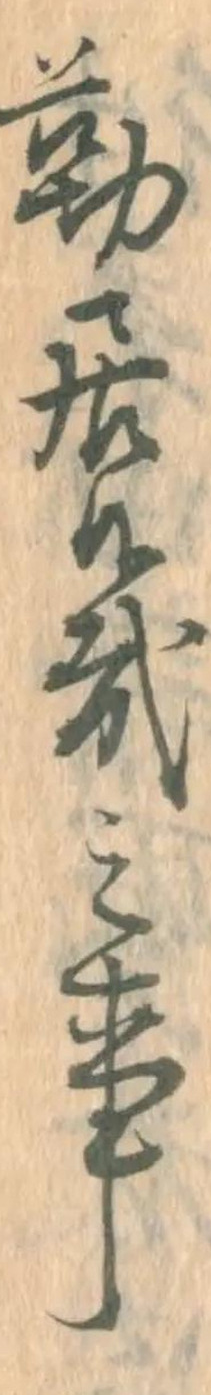勤居候哉之事
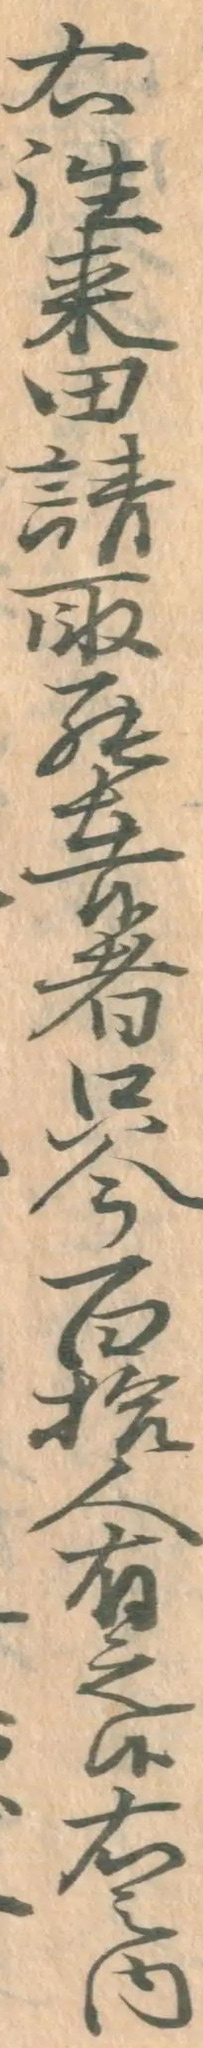右往来田請取罷在候者只今百拾人有之候右之内
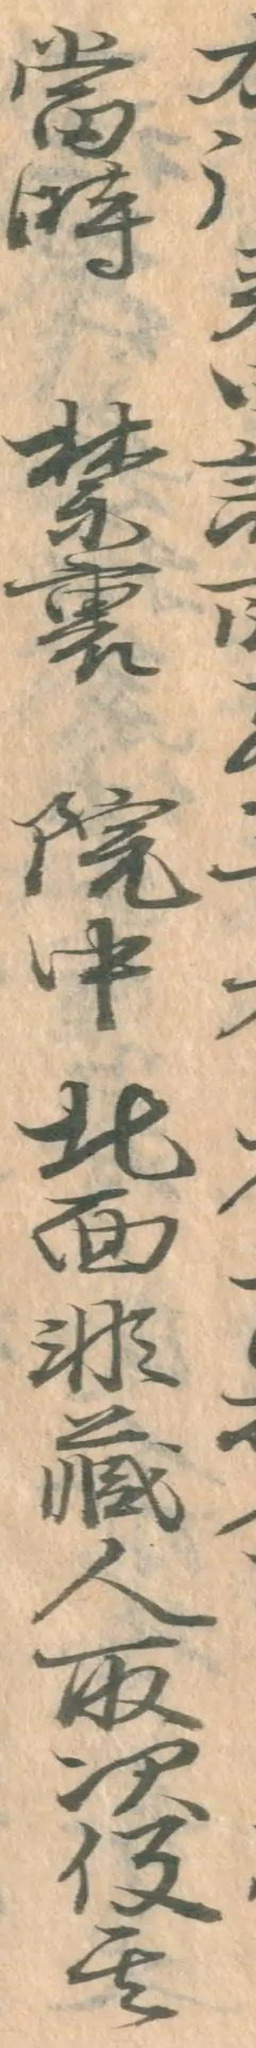當時禁裏院中北面非蔵人取次役其
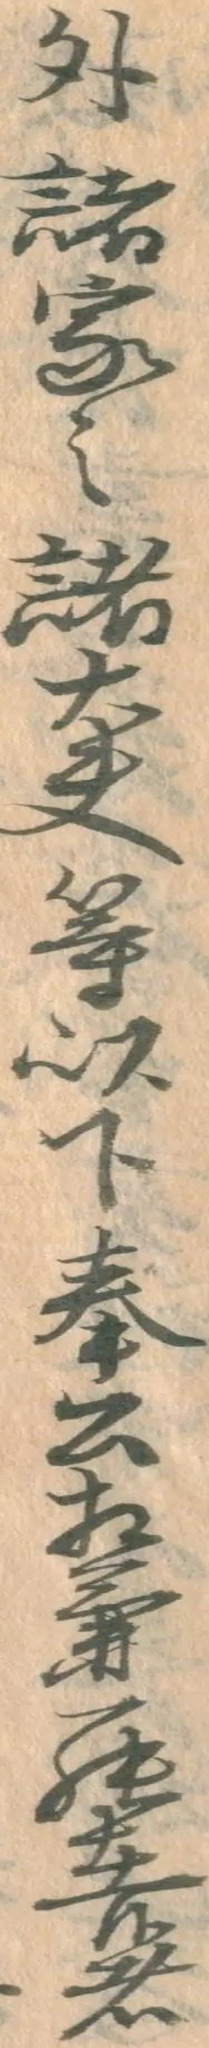外諸家之諸大夫等以下奉公相兼罷在候者
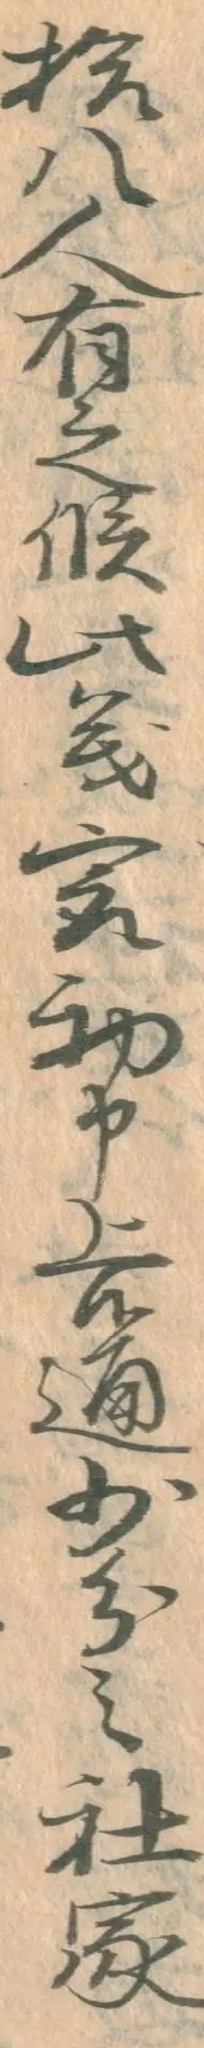拾八人有之候此義最初申上候通少分之社家
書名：賀茂社記録. 第39冊
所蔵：国立国会図書館 National Diet Library, JAPAN
